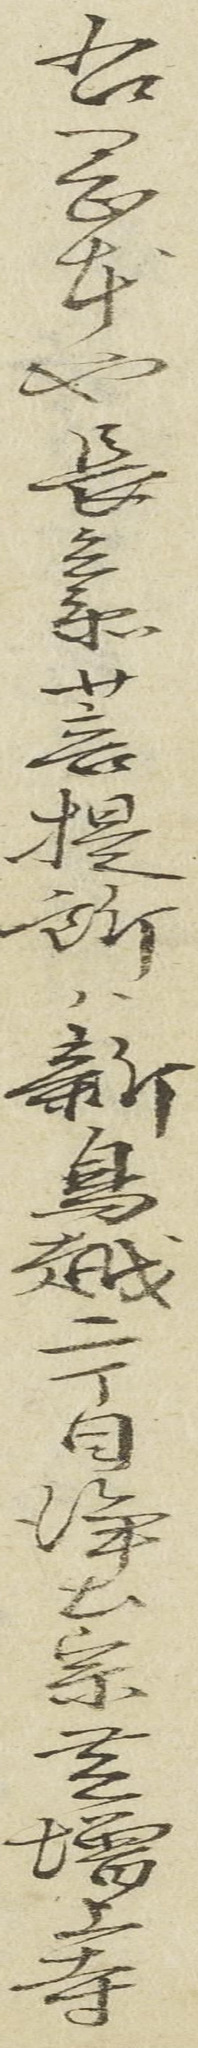右岡本や長兵衛菩提所ハ新鳥越二丁目浄土宗芝増上寺
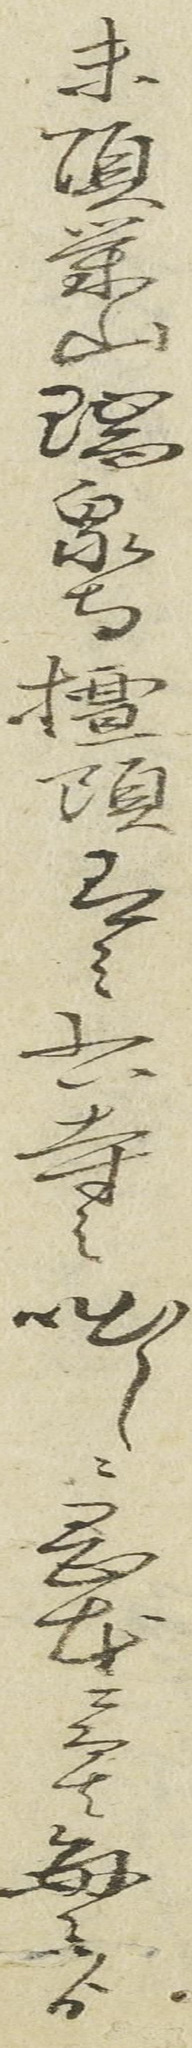末頂栄山瑞泉寺檀頭有之右寺之咄しニ岡本ニ而ハ毎々ゟ
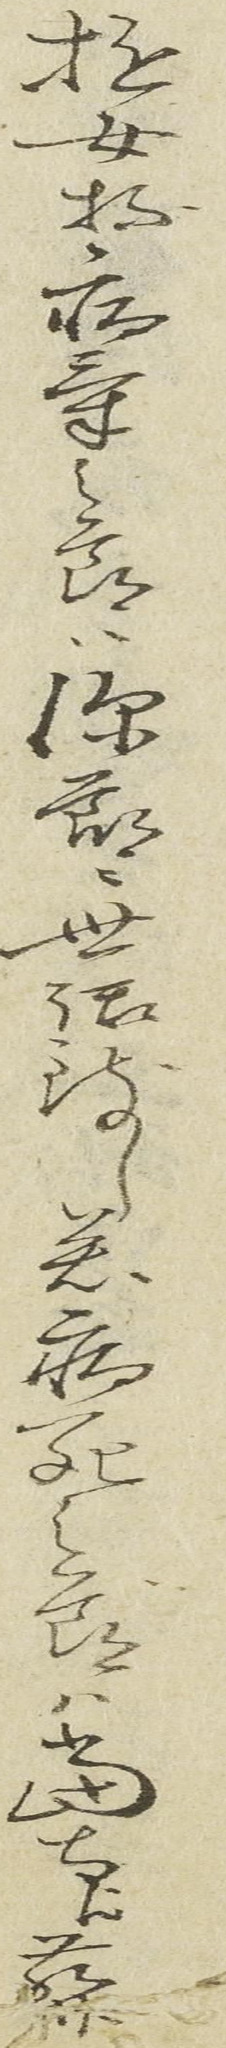遊女抔病気之節ハ深節ニ世話致し若病死之節ハ当寺え葬
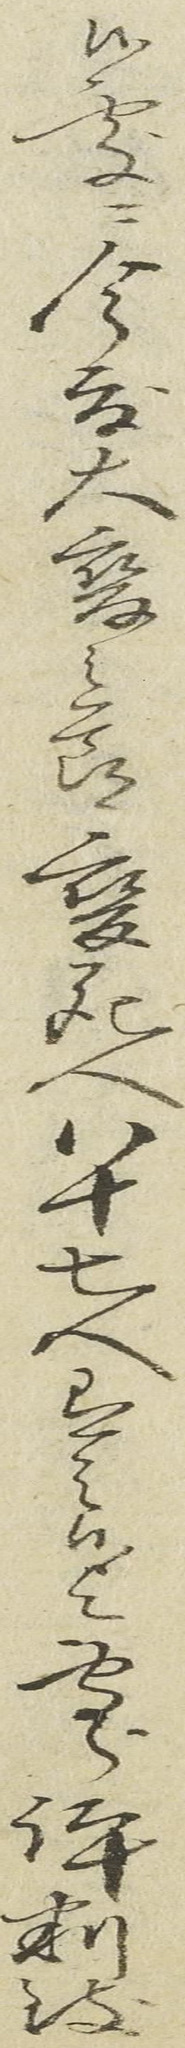候処ニ今度大変之節変死人八十七人有之候と専ら評判致
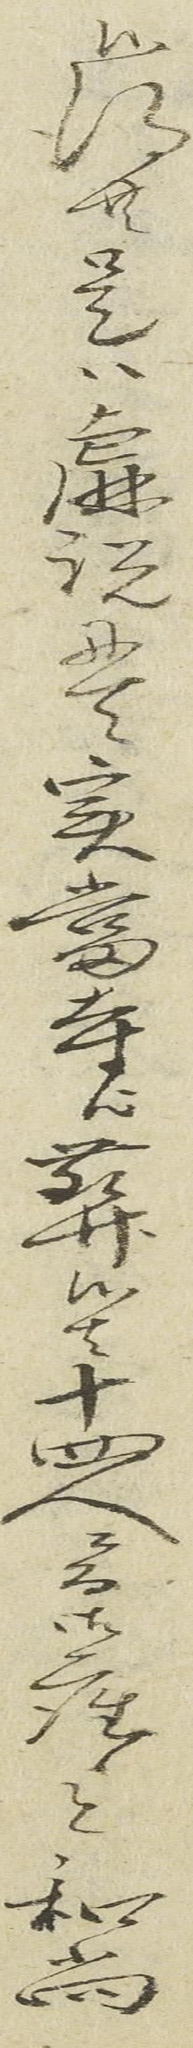候得共是ハ虚説にて実当寺え葬候者十四人ニ而御座候と和尚
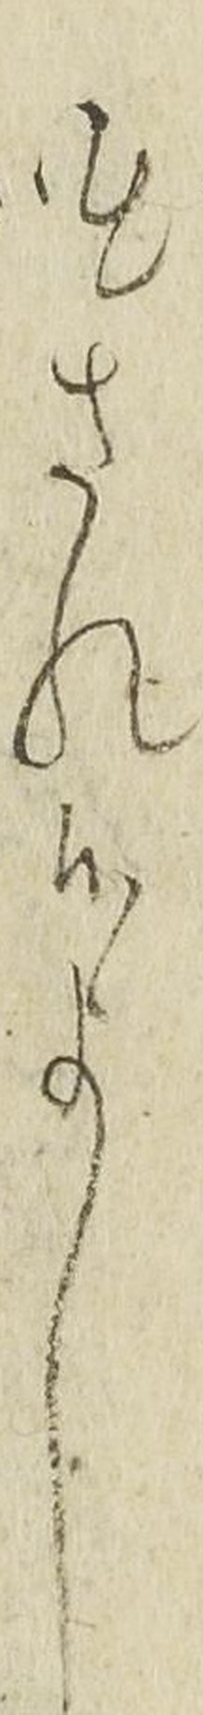咄され候よし
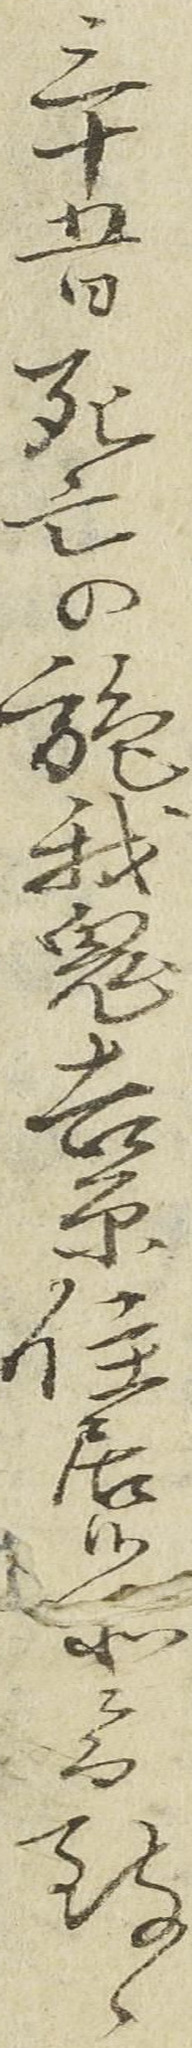二十五日死亡の施餓鬼吉原住居候所ニ而致候

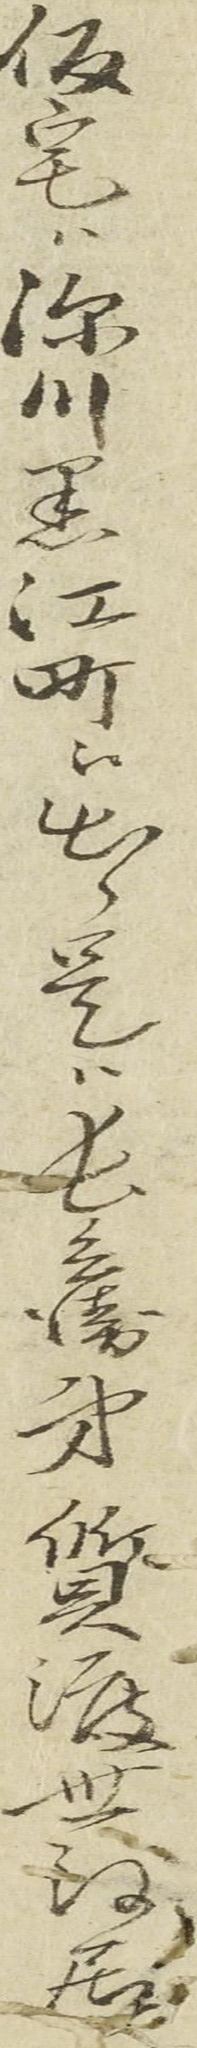仮宅ハ深川黒江町え出候是ハ長兵衛弟質渡世致居
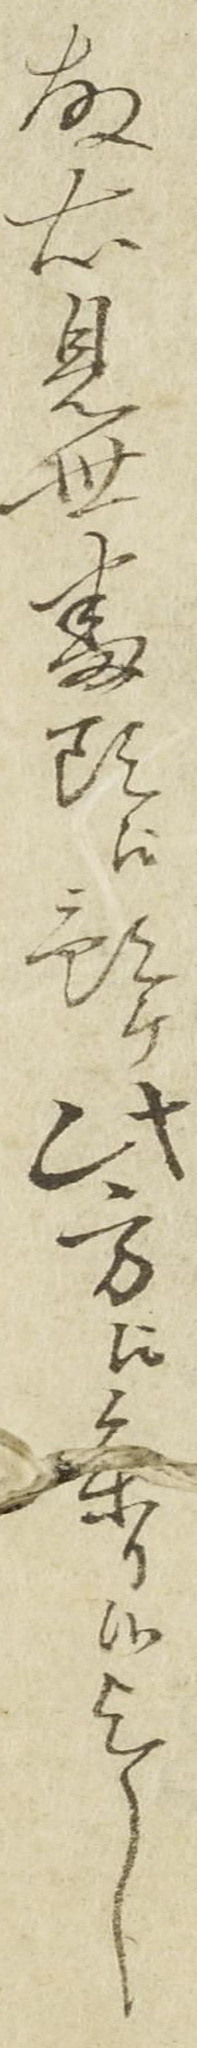故右見世番頭え預ケ此方え参候よし
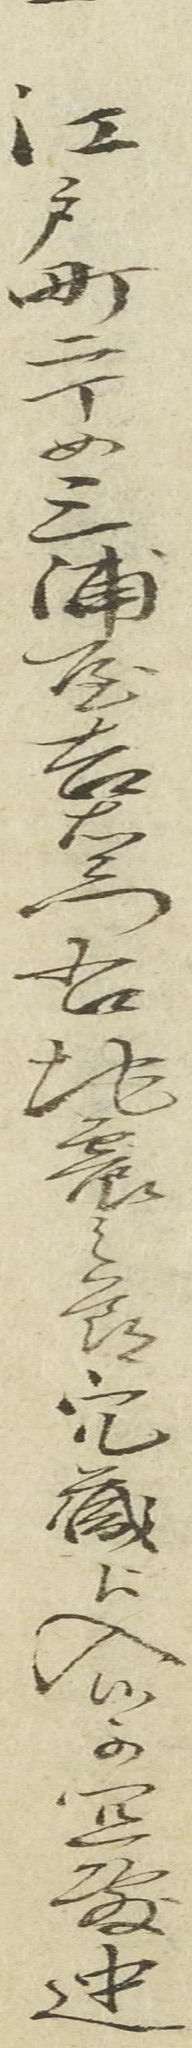一江戸町二丁目三浦屋吉右衛門右地震之節穴藏え入候か宜敷迚
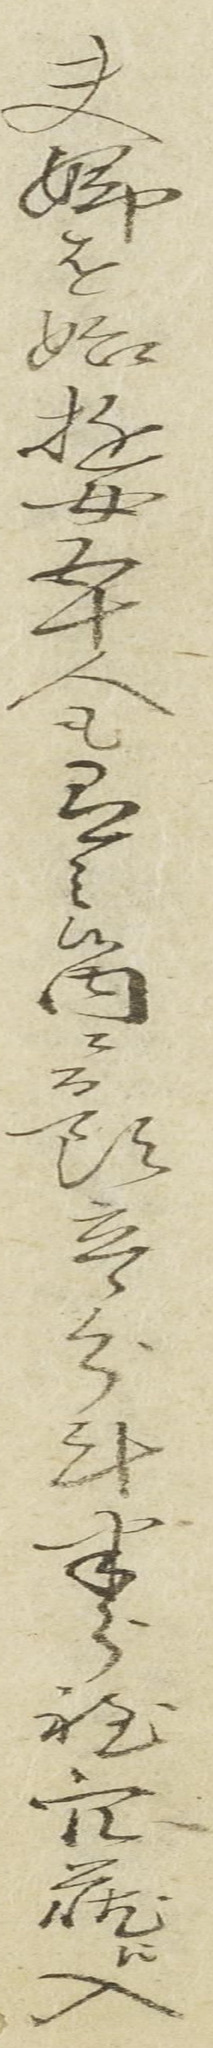夫婦を始め遊女五十人も有之候内ニ而頭立候分斗半分程穴藏え入
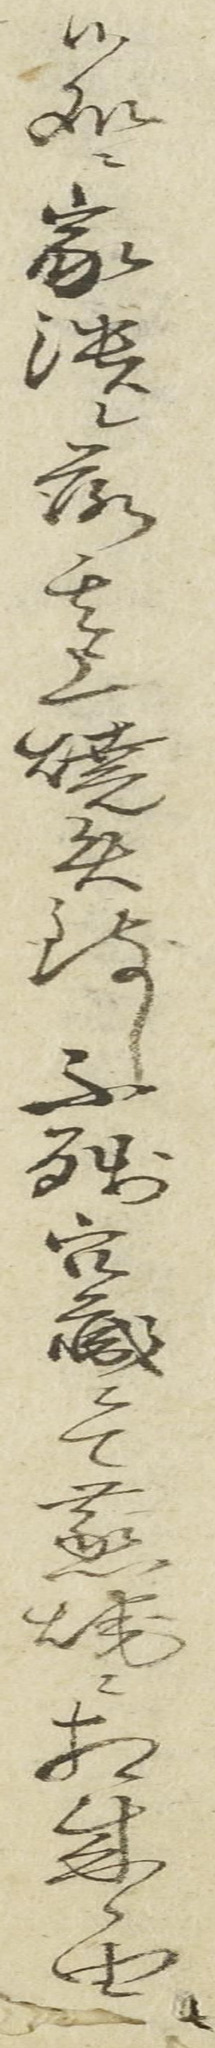候処ニ家潰レ落其上焼失致し不残穴藏ニ而蒸焼ニ相成候由
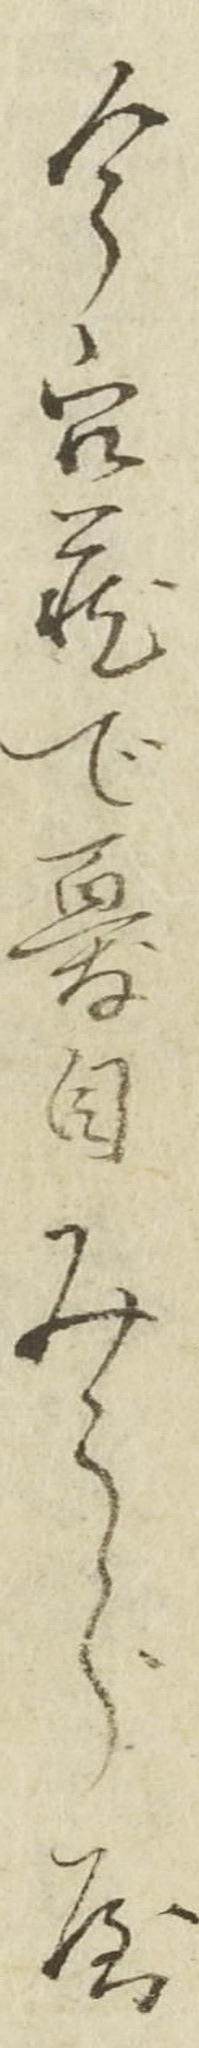今穴で憂目みうら屋
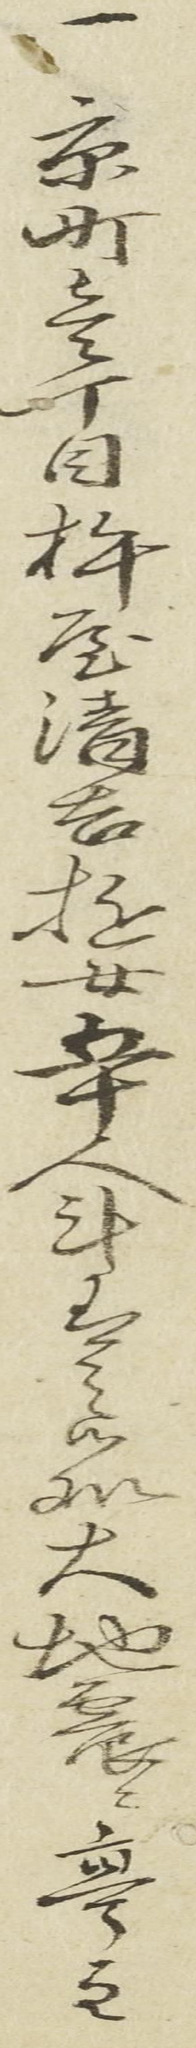一京町一丁目杵屋清吉遊女五十人斗有之候処タ大地震ニ亭主
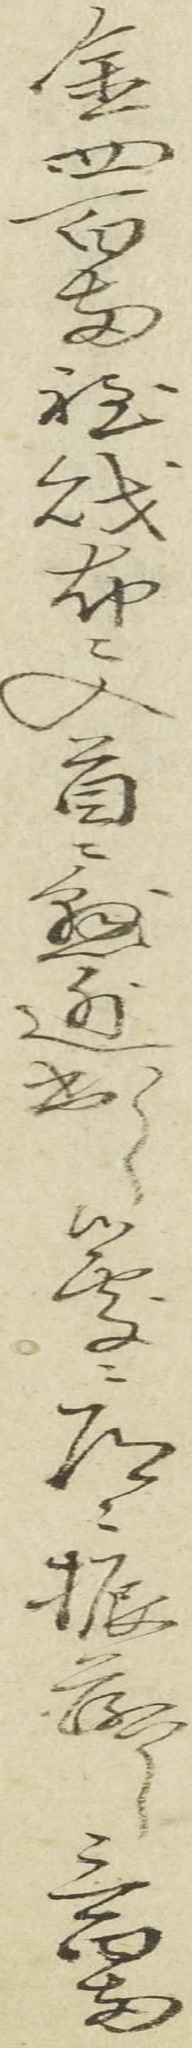金四百両程財布二入首二懸逃出し候処ニ道二振落し三百両
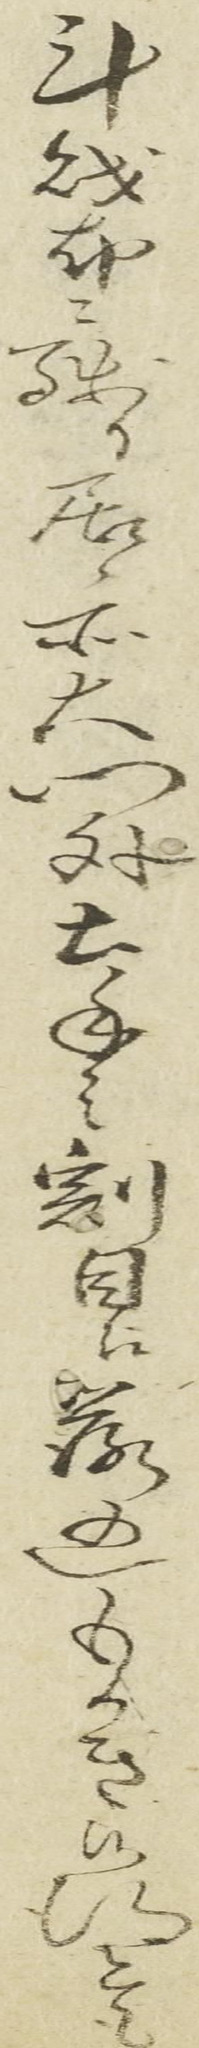斗財布二残り居候所大門外土手之割目え落込もがき候得とも
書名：安政二乙卯年十月二日大地震之事
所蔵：東京大学地震研究所図書室 Earthquake Research Institute Library, The University of Tokyo, JAPAN
